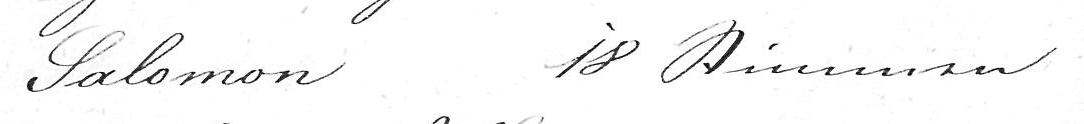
Salomon 18 Stimmen
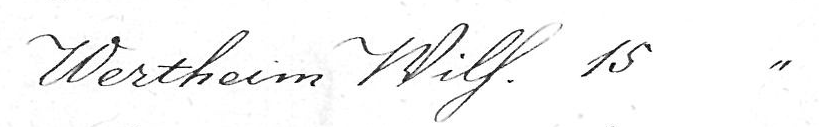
Wertheim Wilh. 15 "
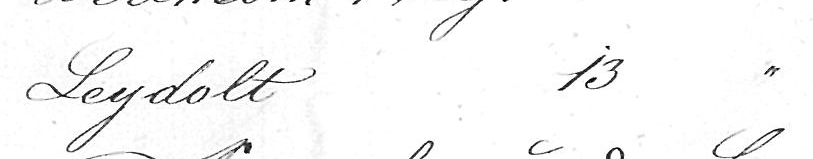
Leydolt 13 "
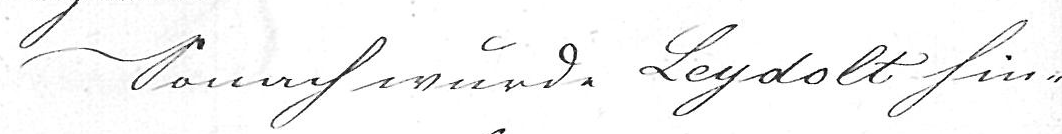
Sonach wurde Leydolt hin-
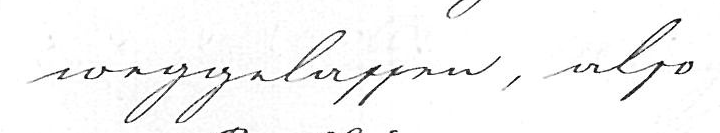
weggelassen, also
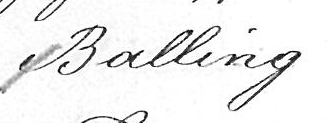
Balling
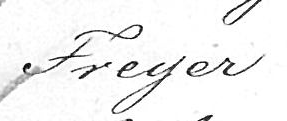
Freyer
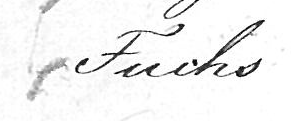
Fuchs
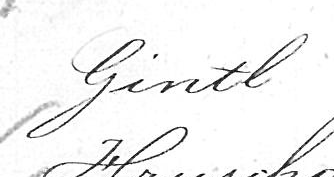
Gintl
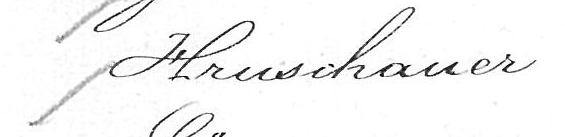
Hruschauer
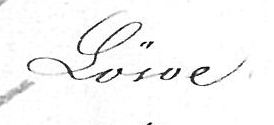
Löwe
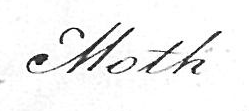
Moth
